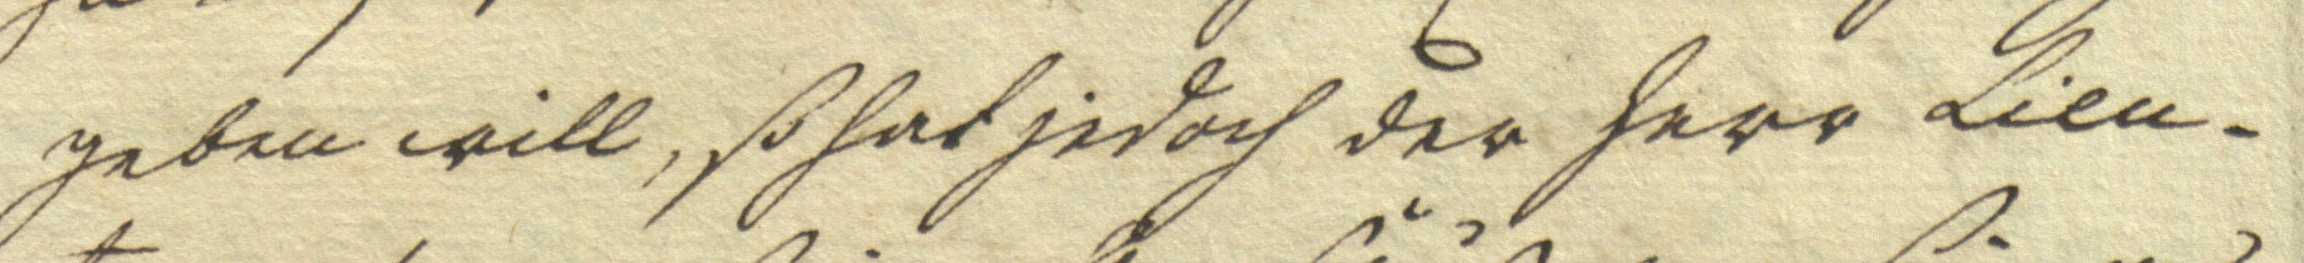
geben will, so hat jedoch der Herr Lieu¬
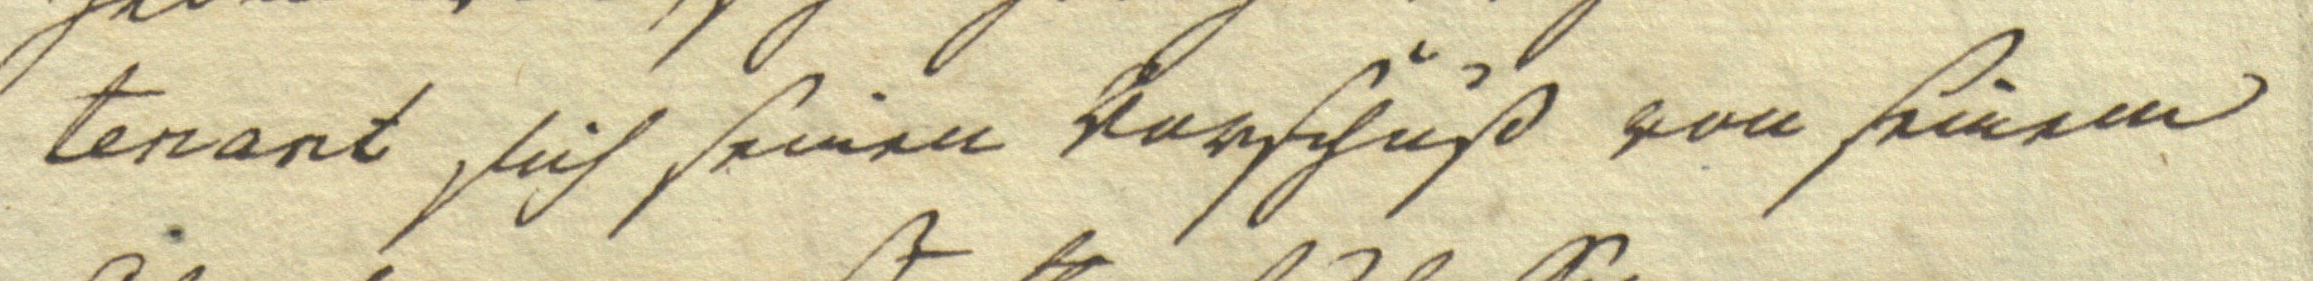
tenant sich seinen Vorschuß von seinem
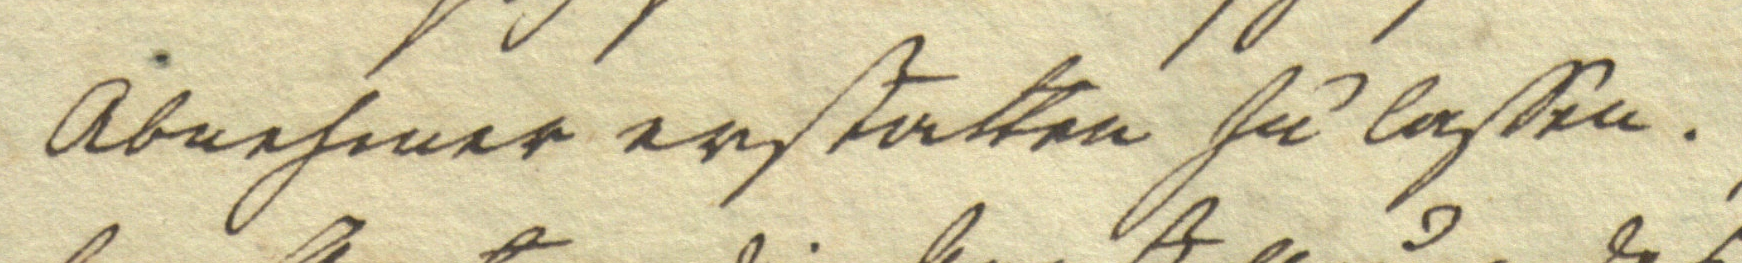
Abnehmer erstatten zu lassen.
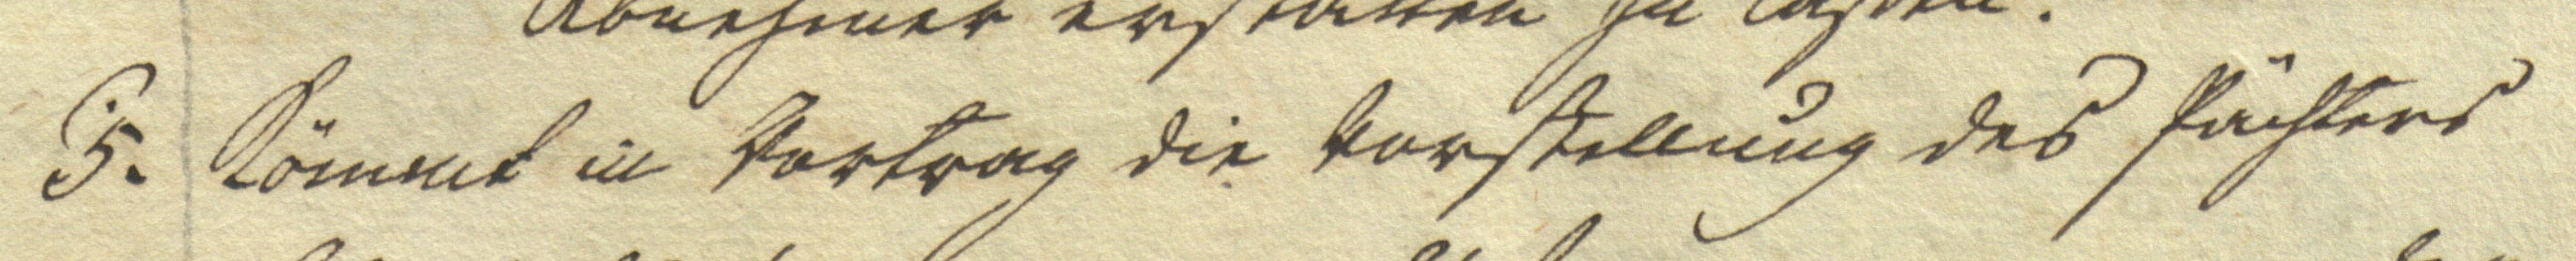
5. Kömmt in Vortrag die Vorstellung des Pächters
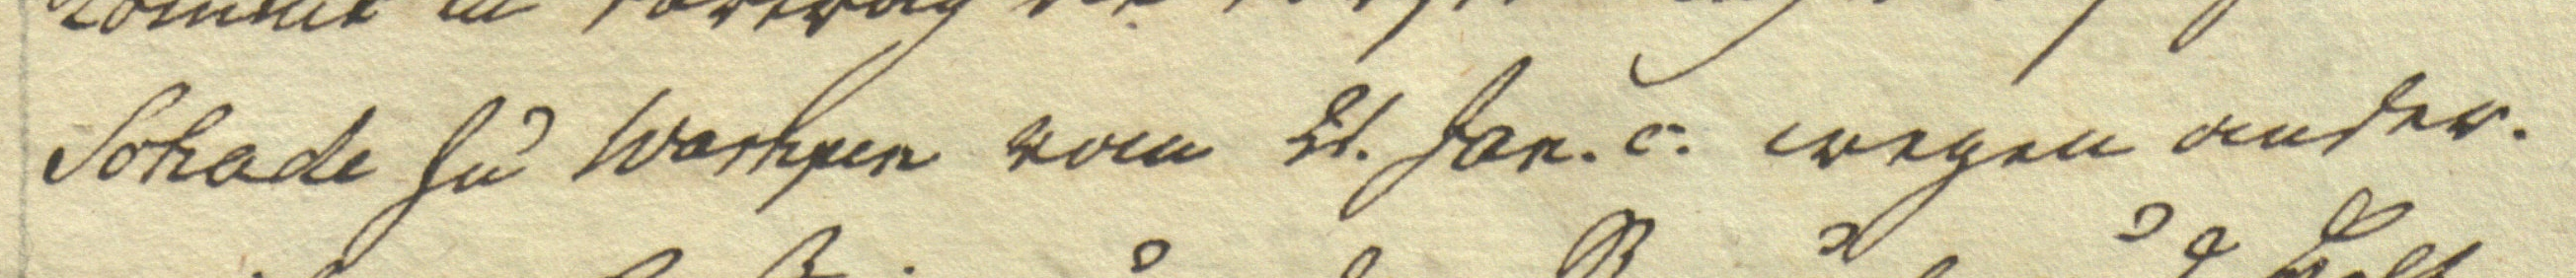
Schade zu Wampen vom 2. Jan. c. wegen ander¬
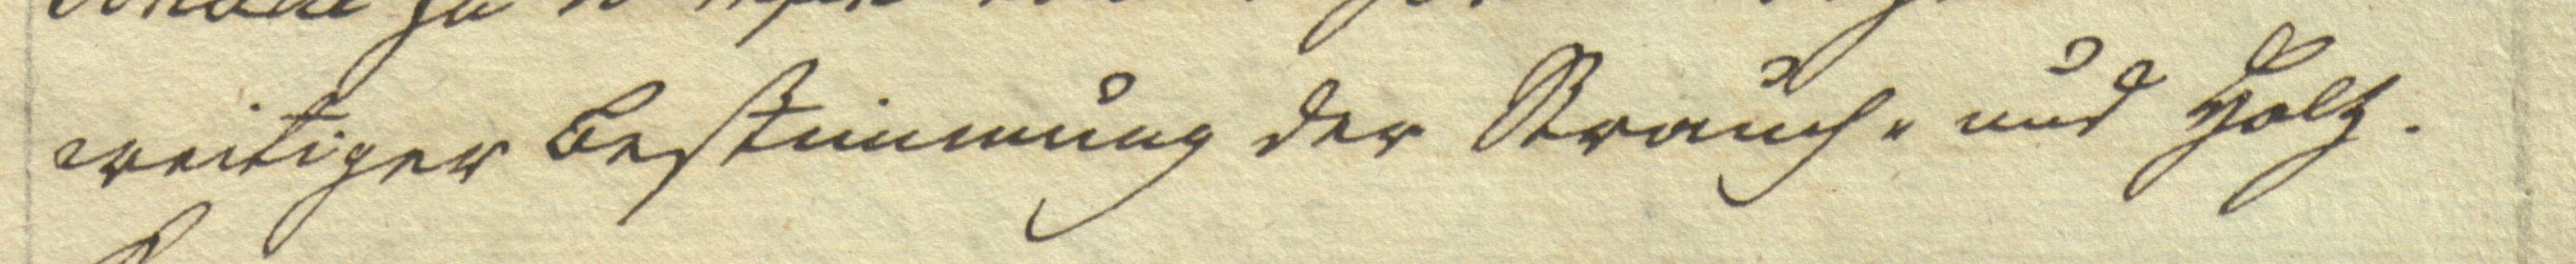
weitiger Bestimmung der Strauch- und Holz-
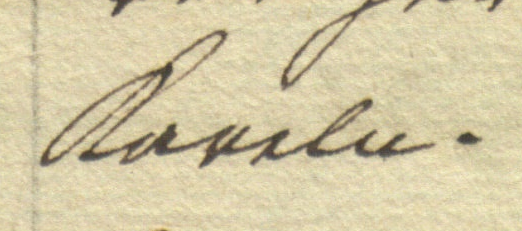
Kaveln.
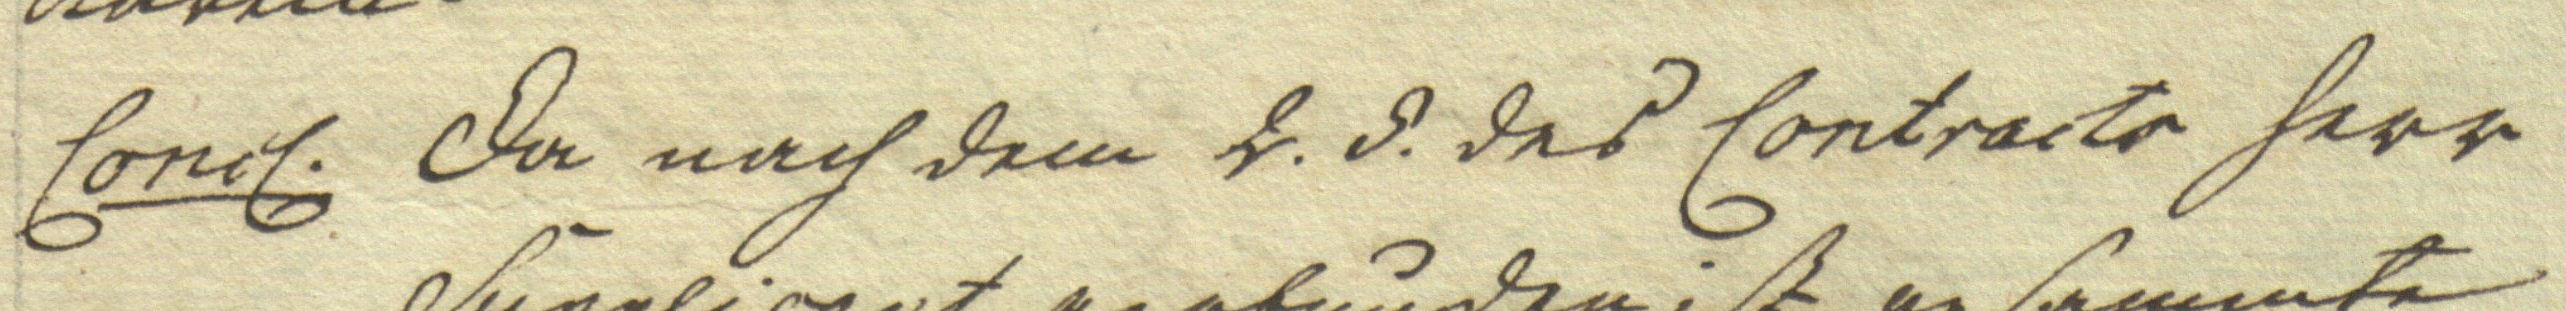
Concl. Da nach dem 2. §. des Contracts Herr
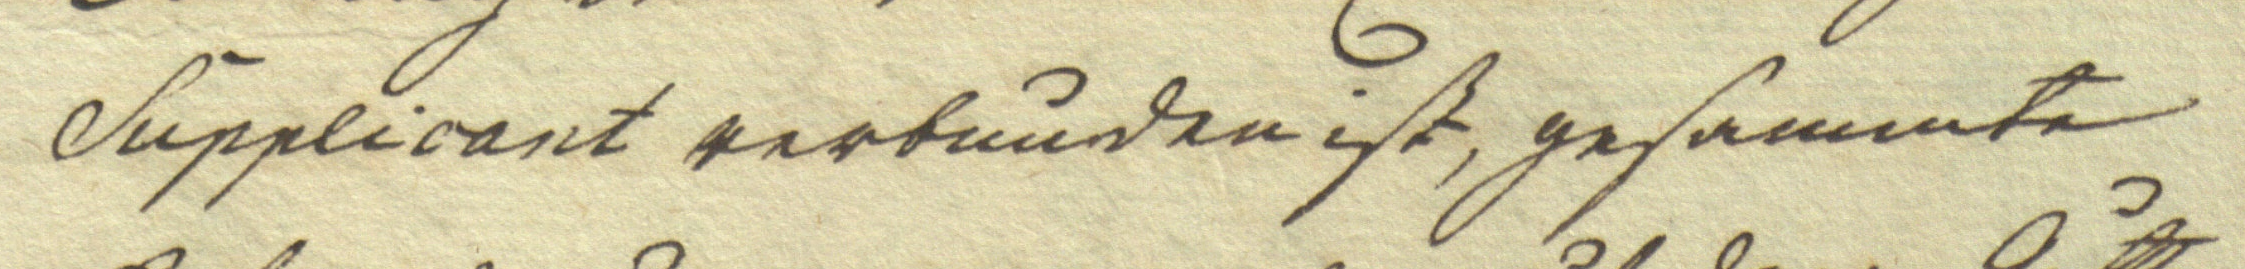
Supplicant verbunden ist, gesammte
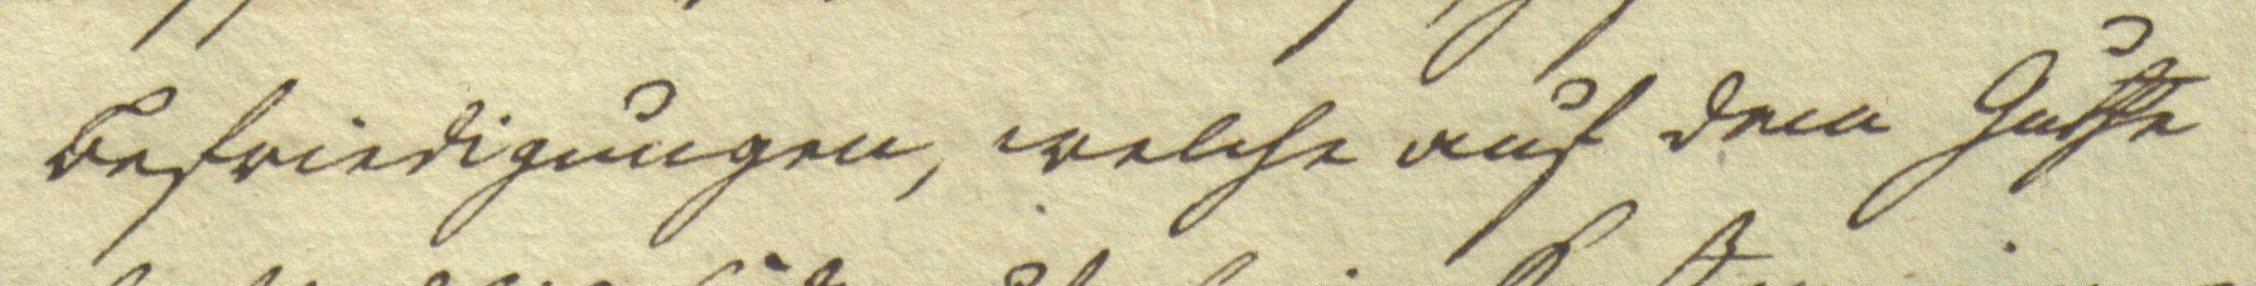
Befriedigungen, welche auf dem Guthe
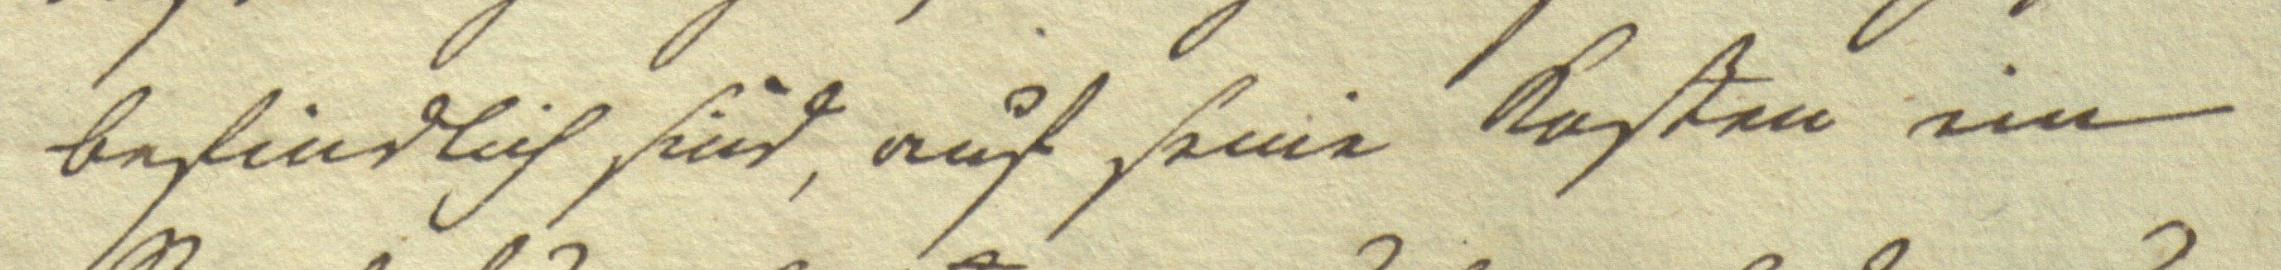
befindlich sind, auf seine Kosten im
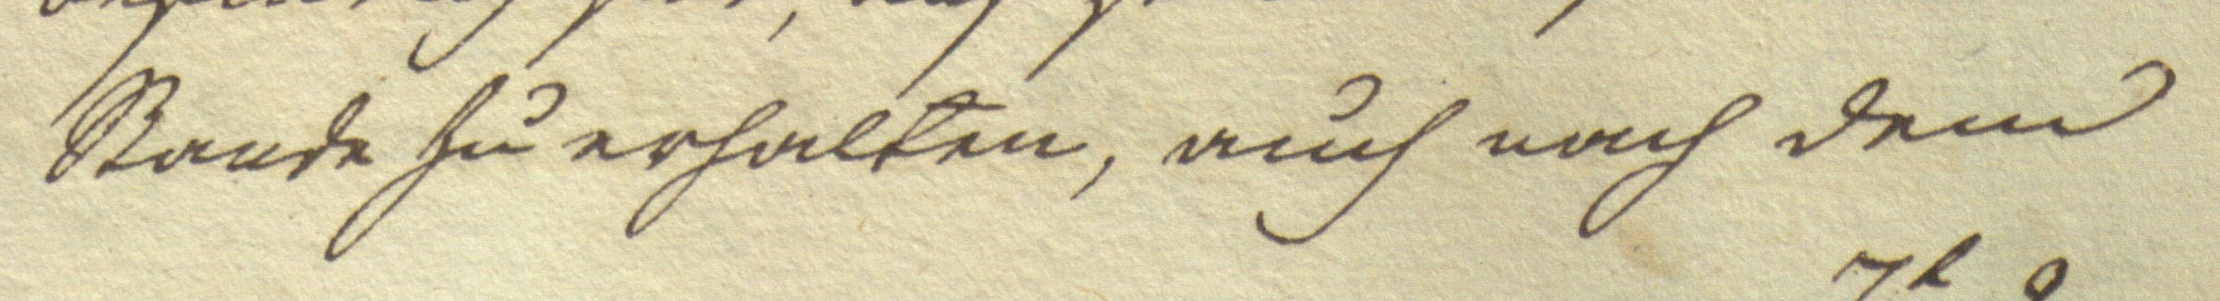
Stande zu erhalten, auch nach dem
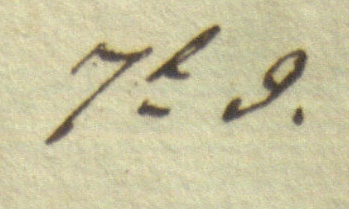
7t §
